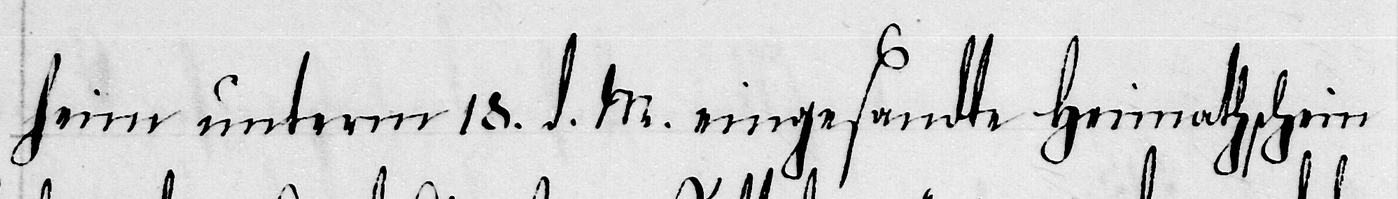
heim unterm 18. d. M. eingesandte Heimathschein
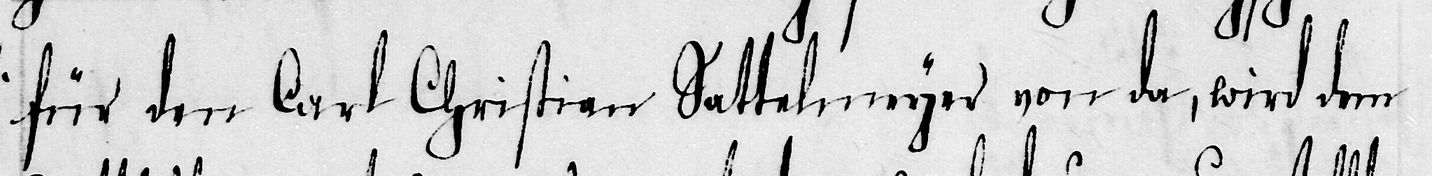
für den Carl Christian Sattelmeyer von da, wird dem
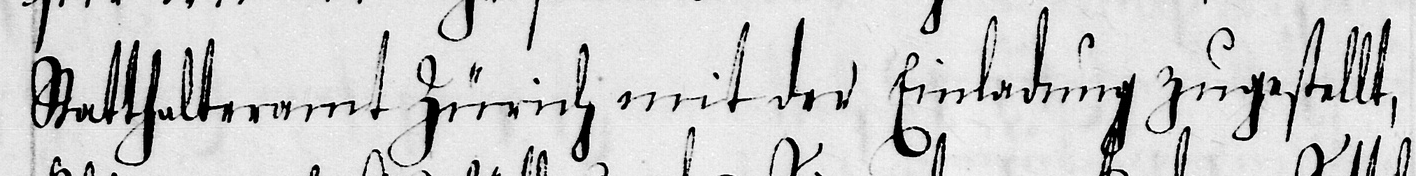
Statthalteramt Zürich mit der Einladung zugestellt,
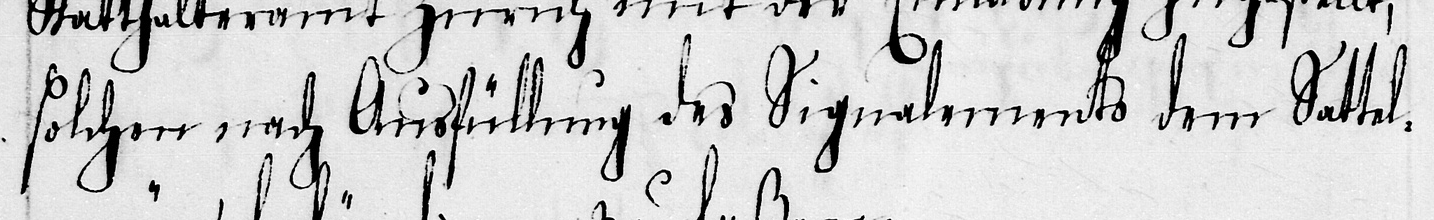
solchen nach Ausfüllung des Signalements dem Satt¬
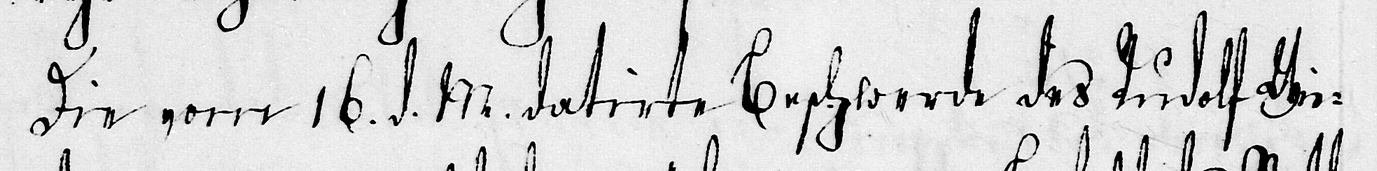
Die vom 16. d. M. datirte Beschwerde des Rudolf Wie¬
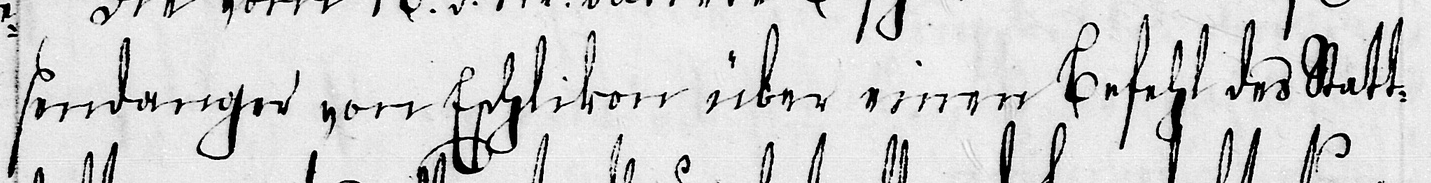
sendanger von Eschlikon über einen Befehl des Stat¬
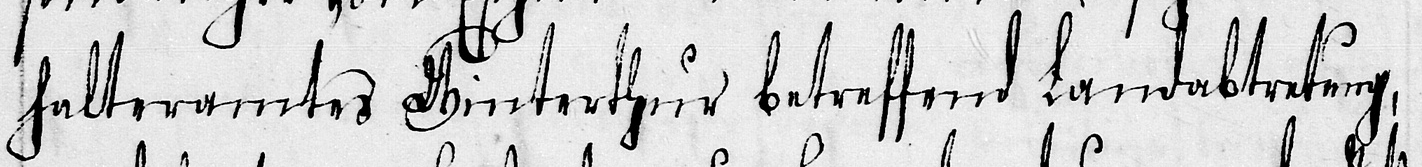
thalteramtes Winterthur betreffend Landabtretung,
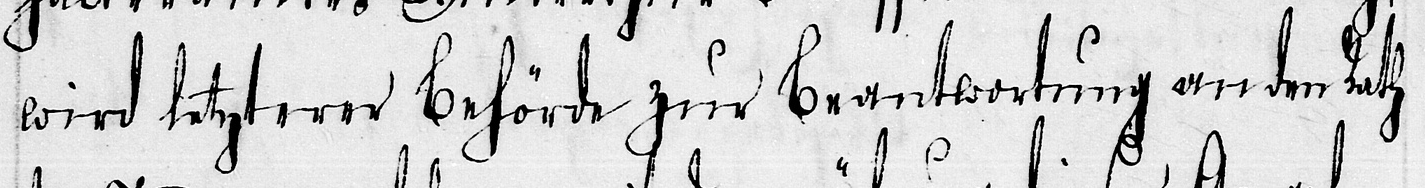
wird letzterer Behörde zur Beantwortung an den Rath
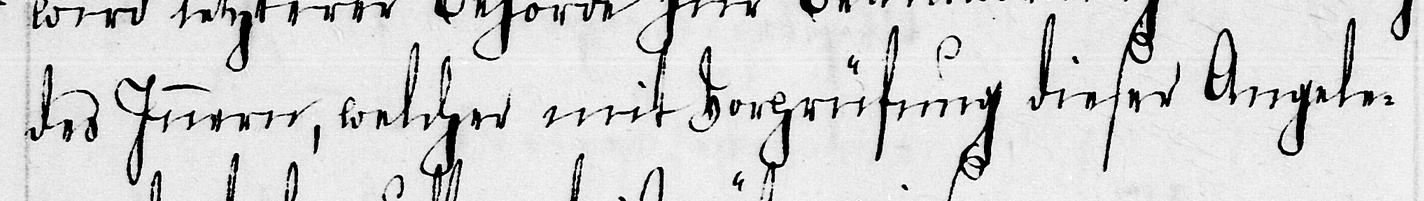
des Innern, welcher mit Vorprüfung dieser Angele¬
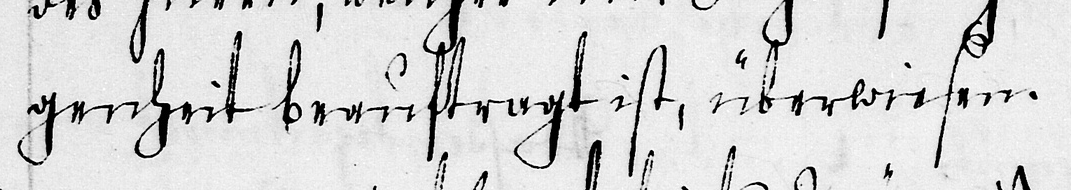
genheit beauftragt ist, überwiesen.
